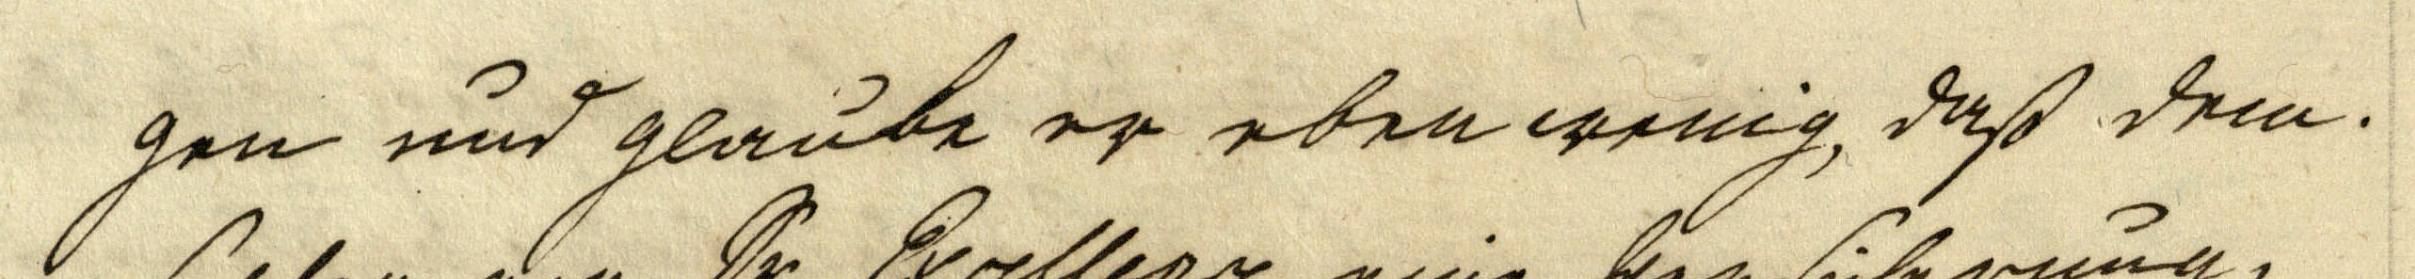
gen und glaube er eben wenig, daß dem-
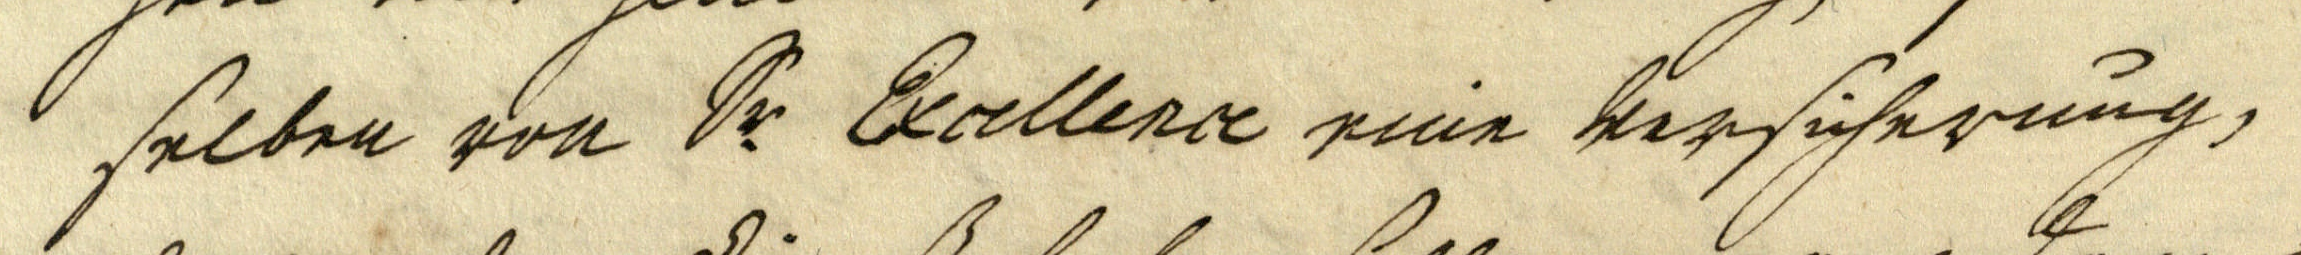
selben von Sr. Excellence eine Versicherung,
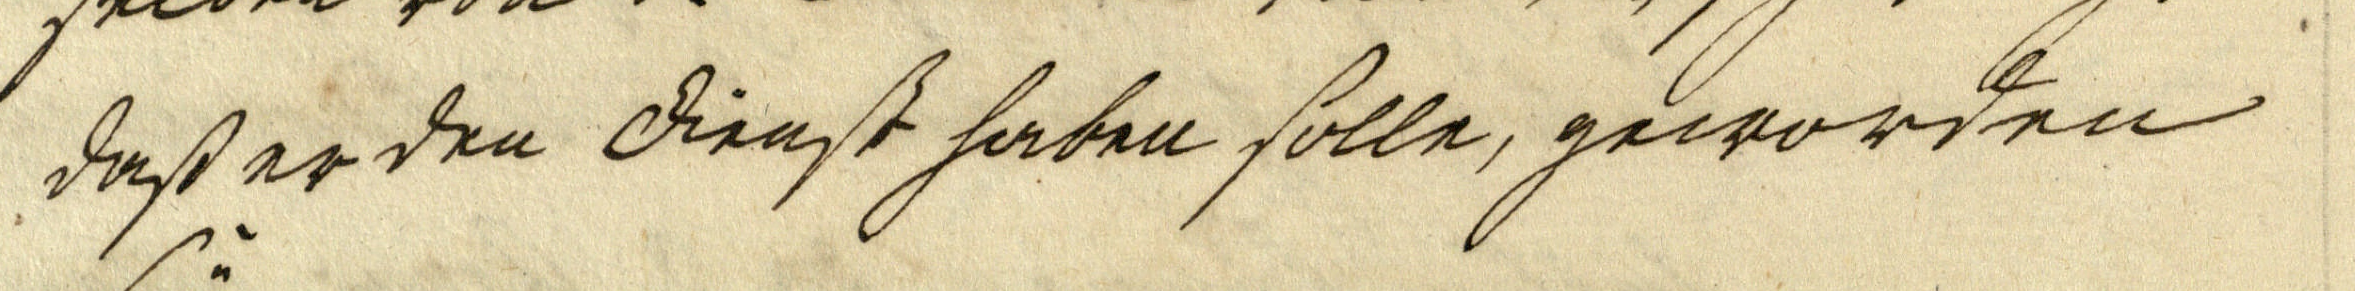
daß er den Dienst haben solle, geworden
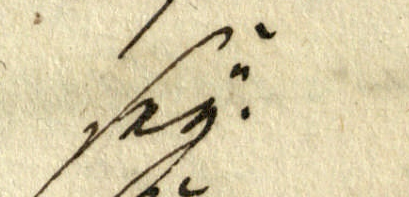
sey.
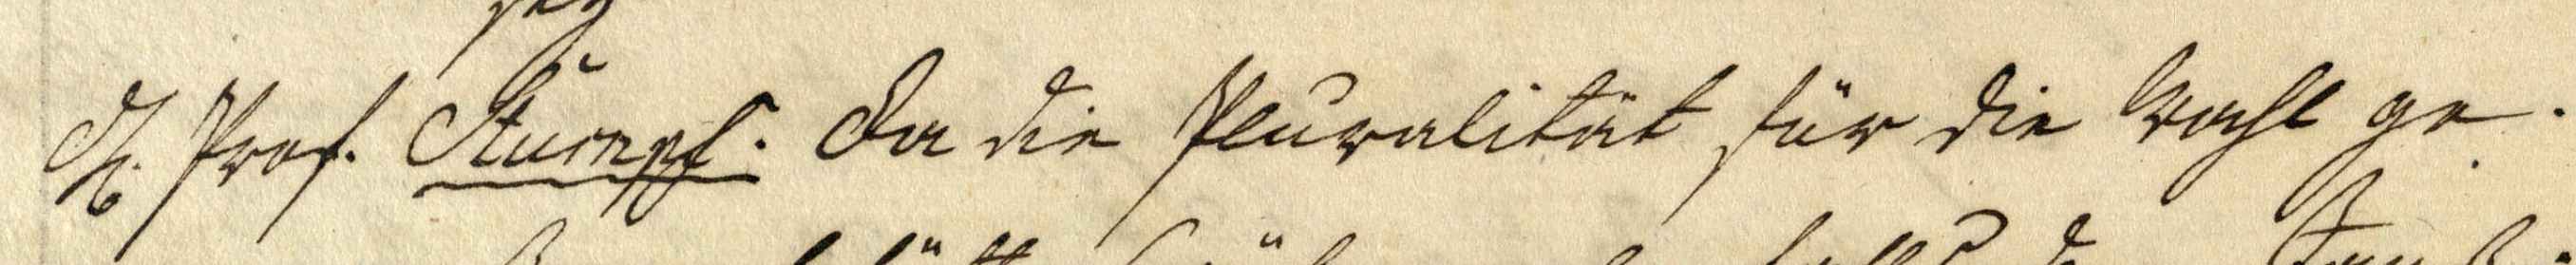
dh. Prof. Stumpf. Da die Pluralität für die Wahl ge-
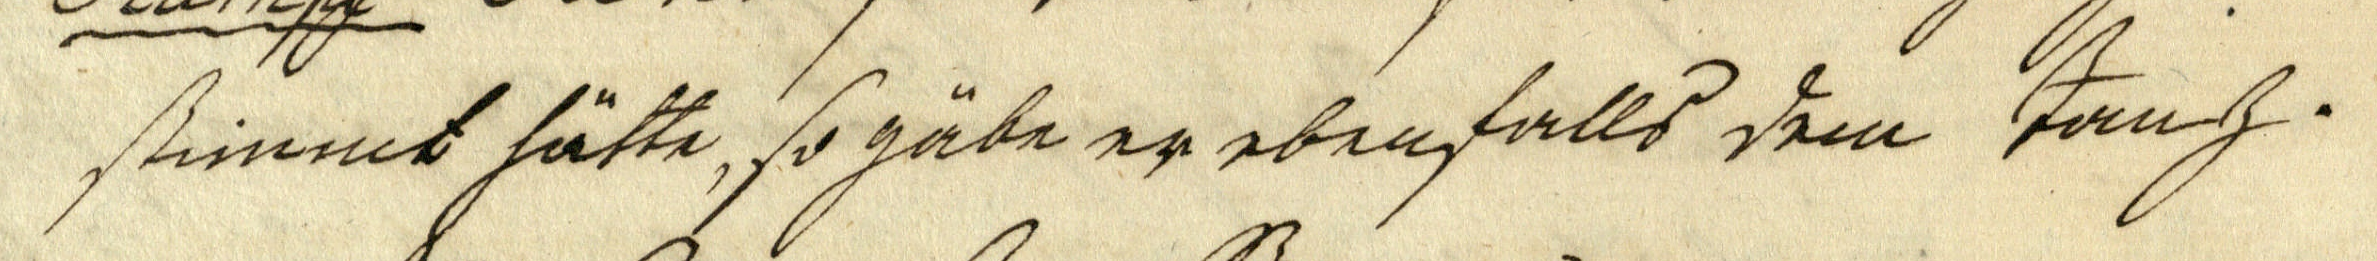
stimmt hätte, so gäbe er ebenfalls dem Tanz-
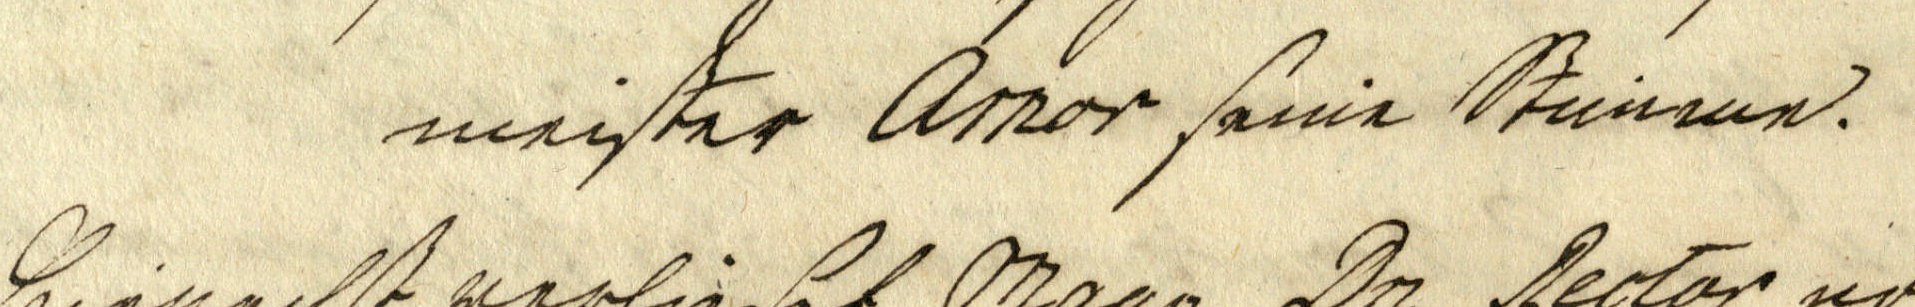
meister Amor seine Stimme.
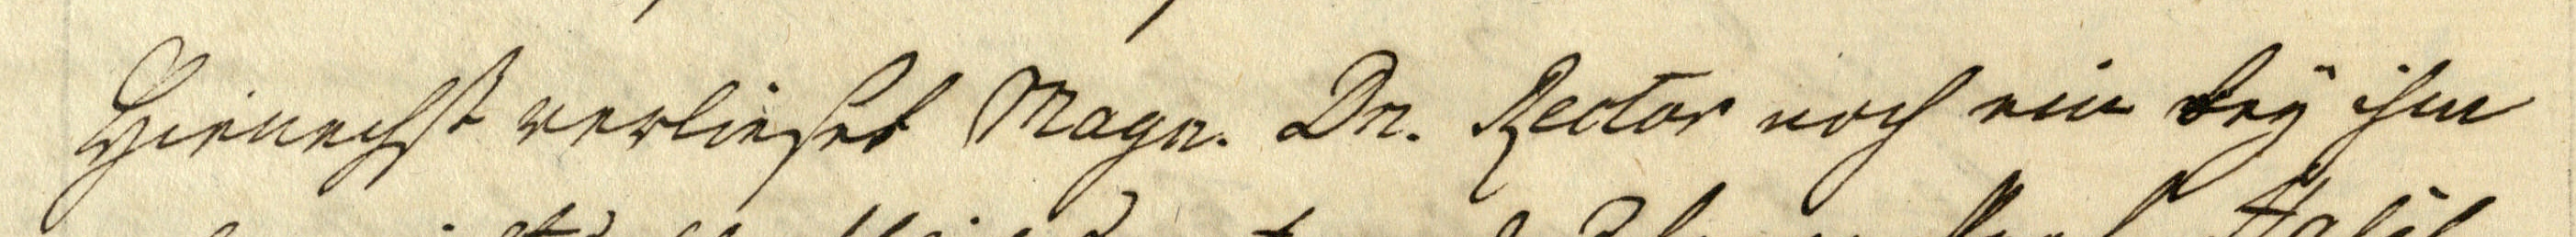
Hienechst verlieset Magn. Dn. Rector noch ein bey ihm
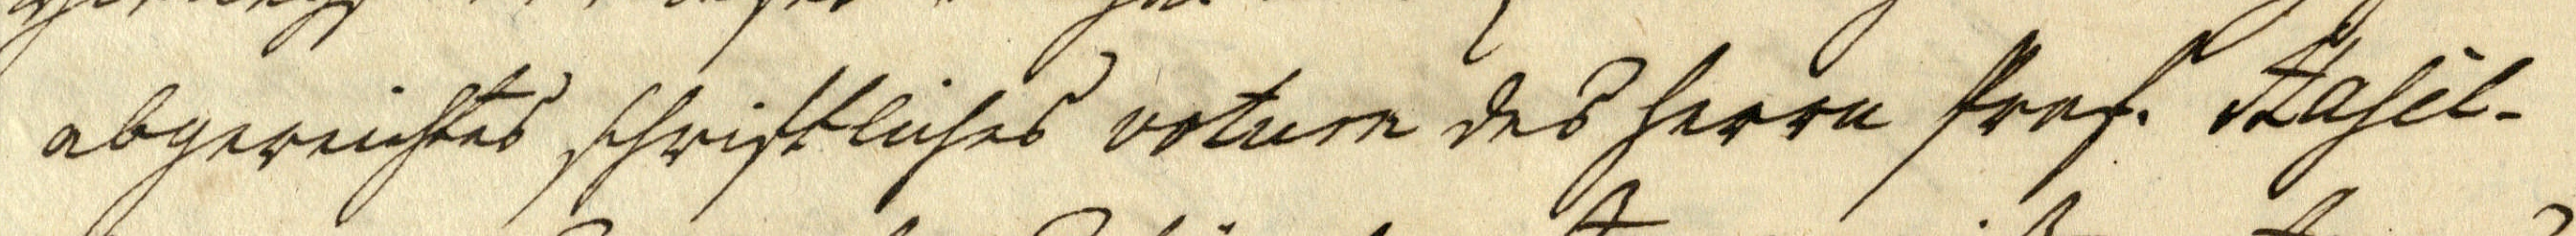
abgereichtes schriftliches votum des herrn Prof. Hasel-
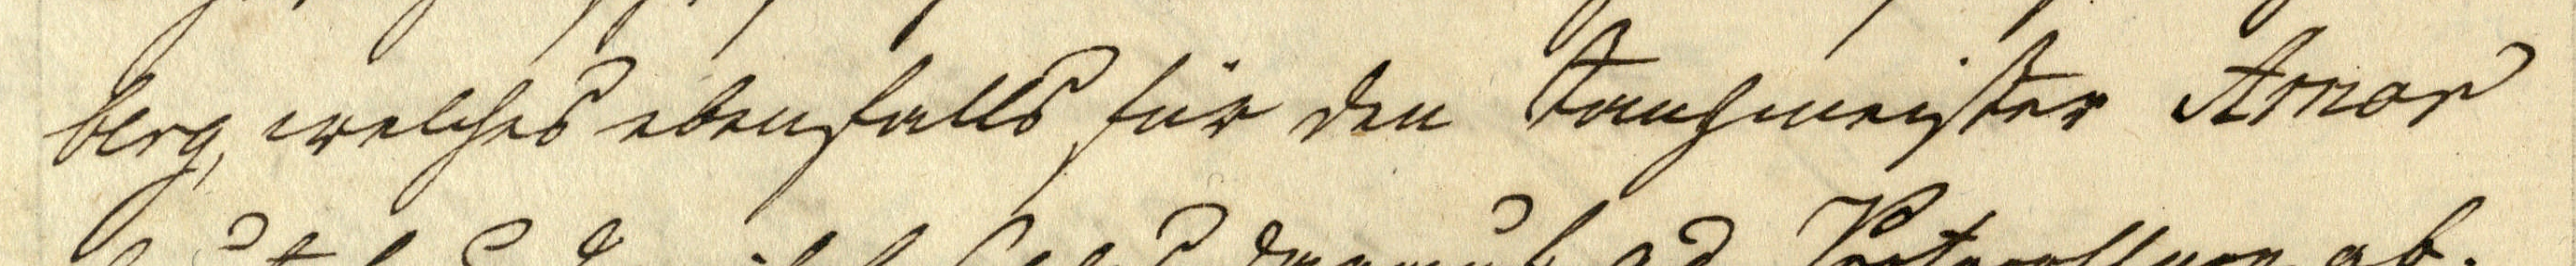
berg, welches ebenfalls für den Tanzmeister Amor
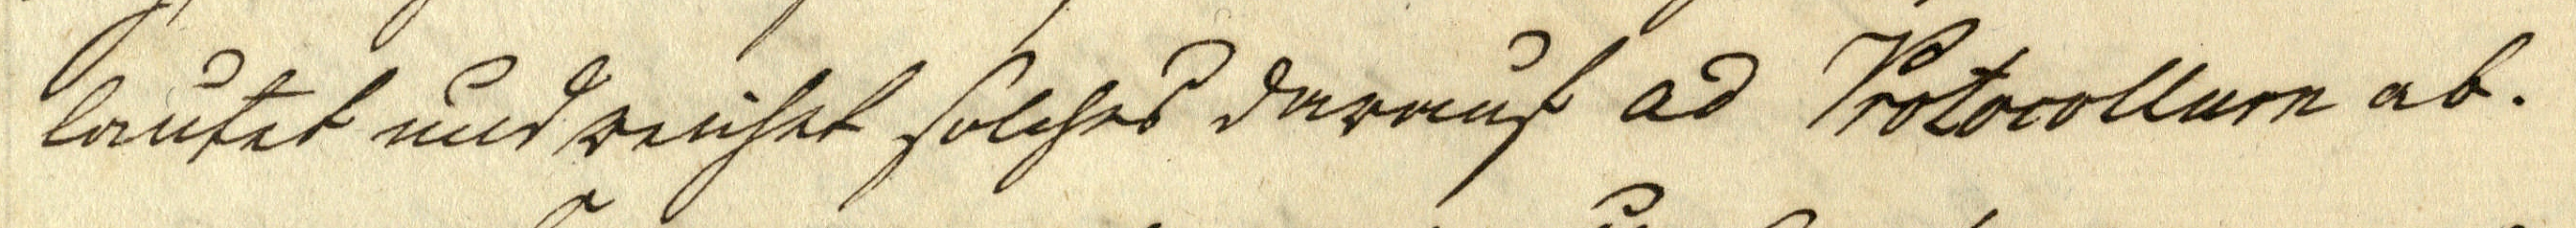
lautet und reichet solches darauf ad Protocollum ab.
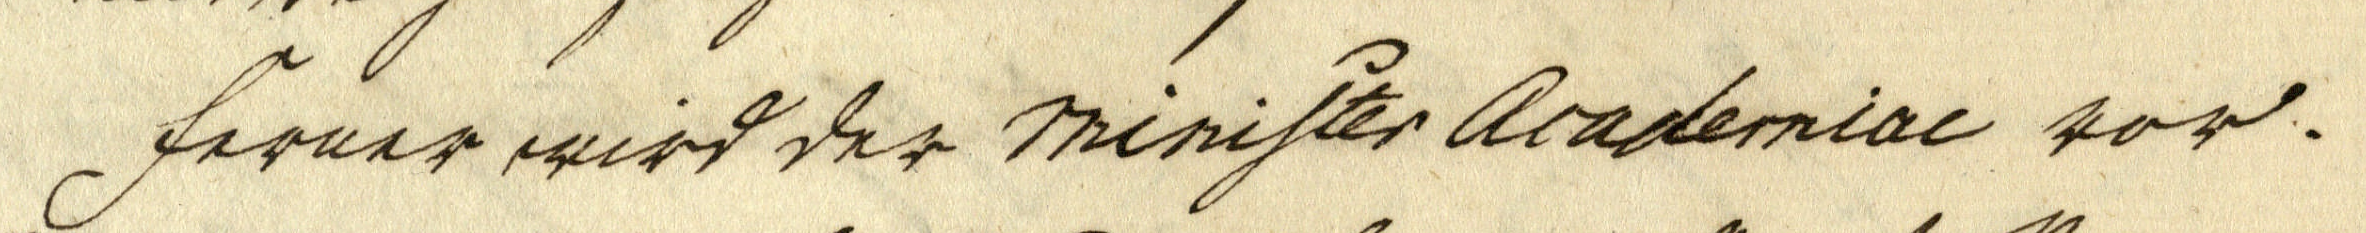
Ferner wird der Minister Academiae vor-
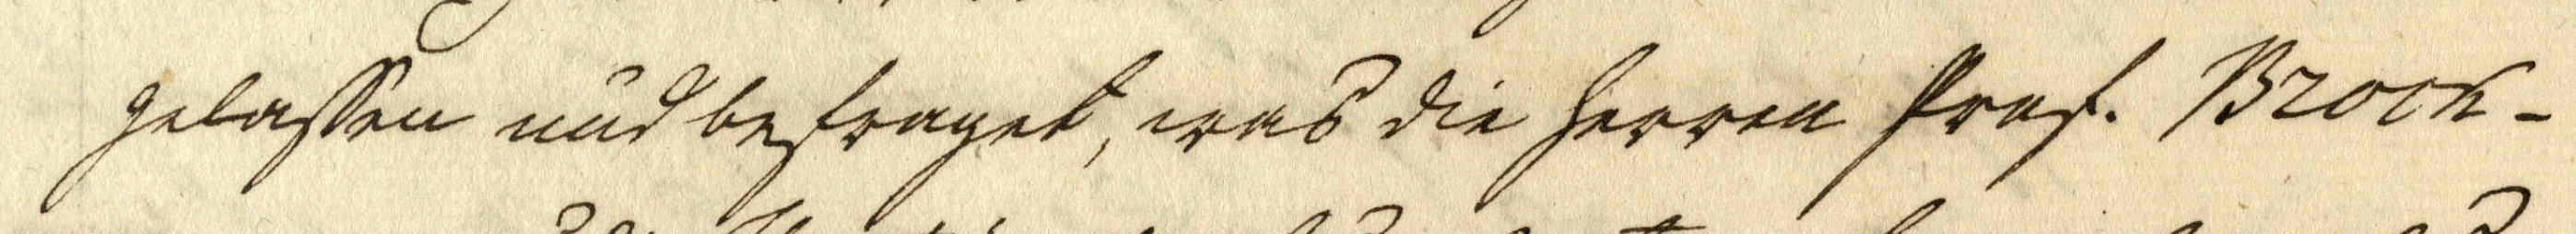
gelassen und befraget, was die Herrn Prof. Brock-
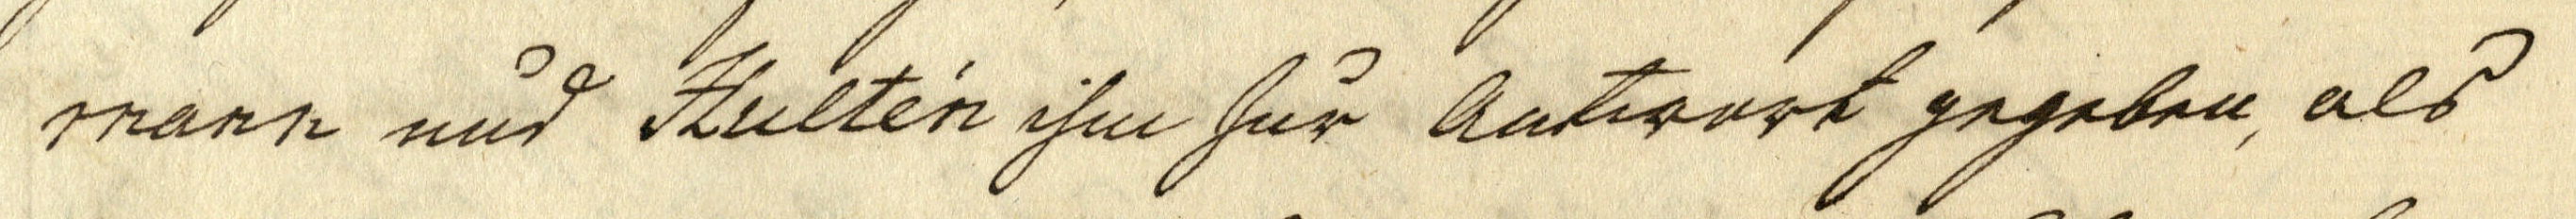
mann und Hultén ihm zur Antwort gegeben, als
